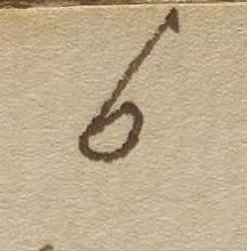6
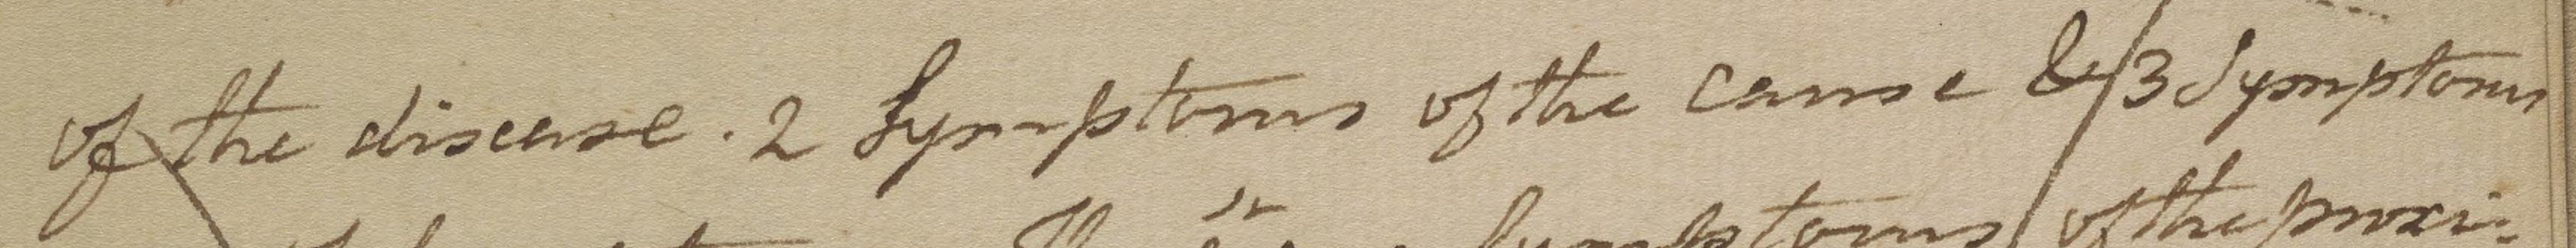of the disease. 2. Syptoms of the cause, & 3 Symptoms
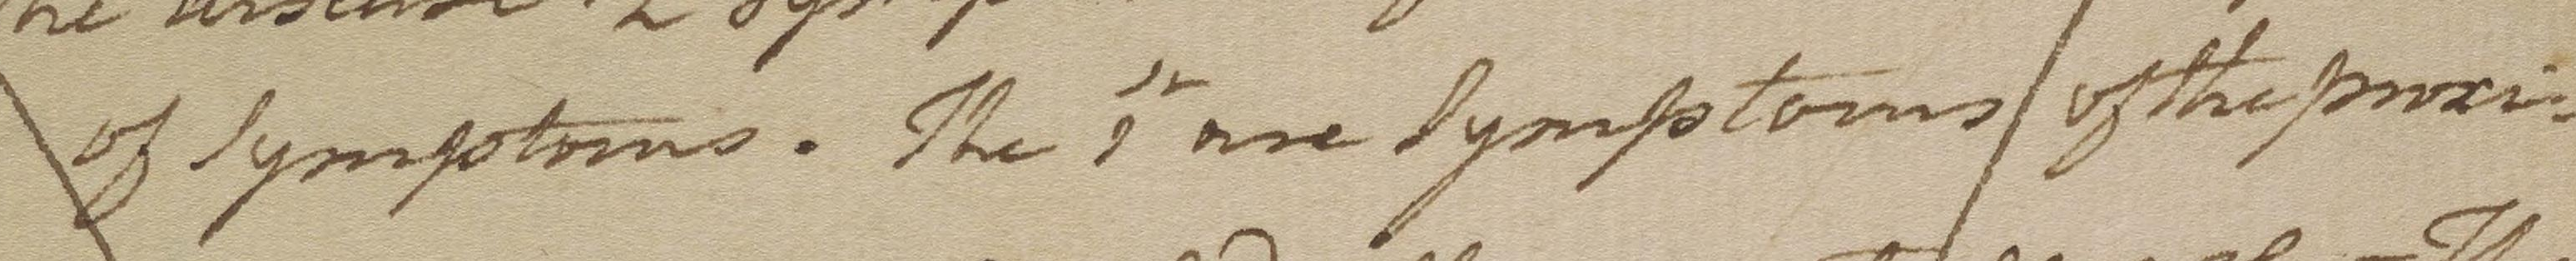of Symptoms. The 1^st are symptoms of the proxi-
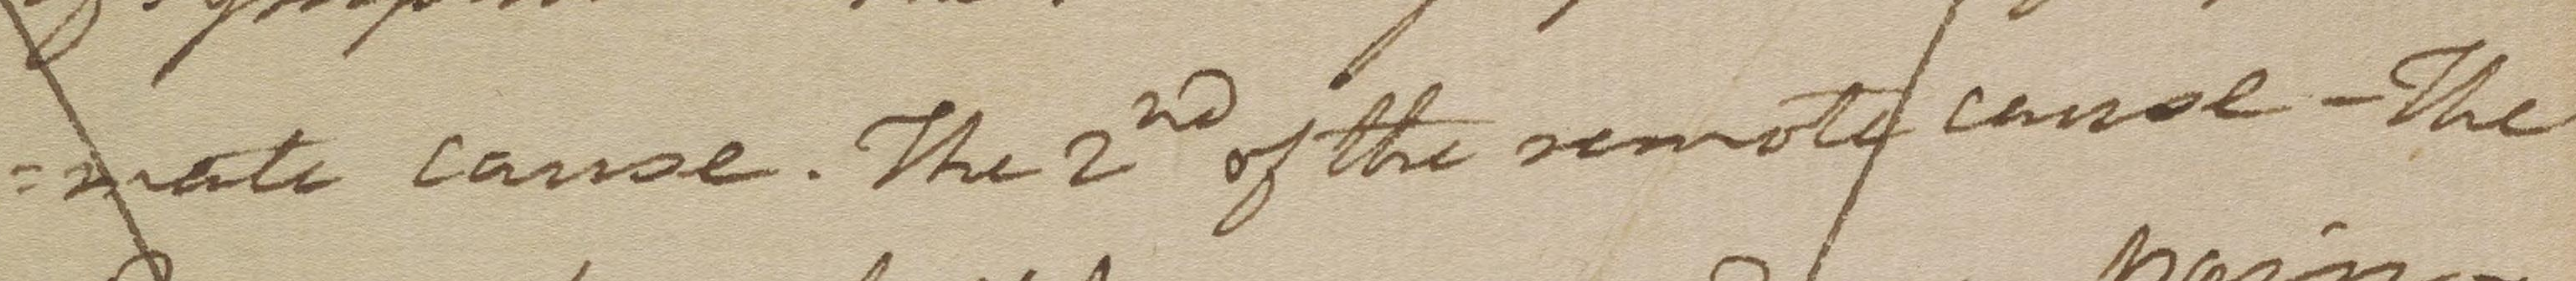-mate cause. The 2^nd of the remote cause. The
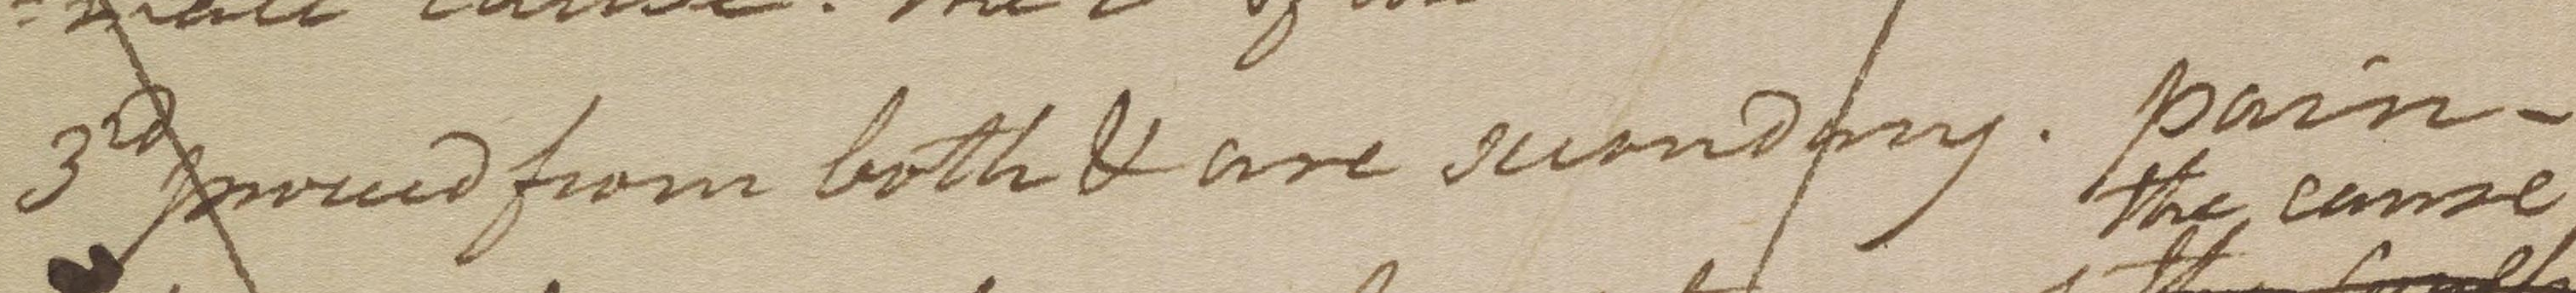3^rd proceed from both & are secondary pain,
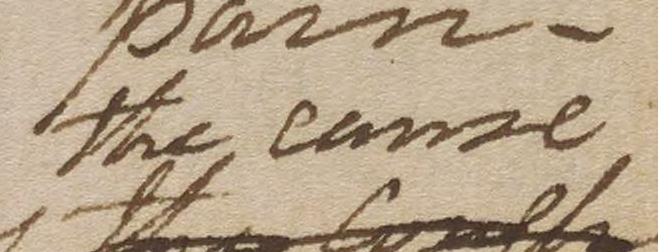the cause
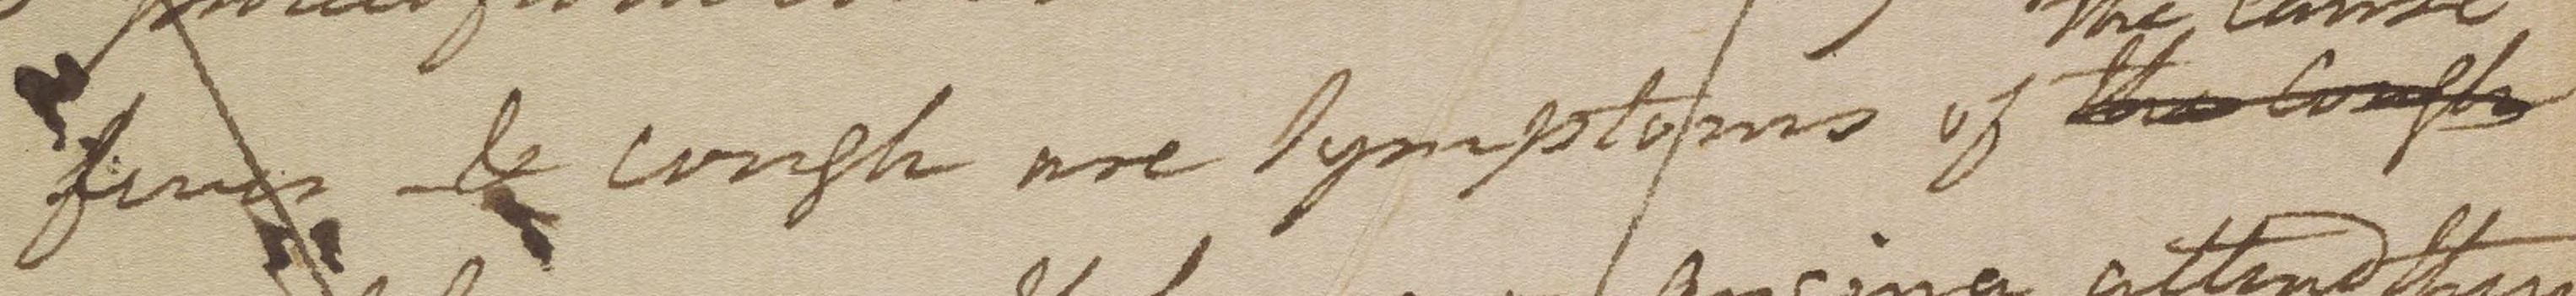fever & cough are symptoms of [the Cough]
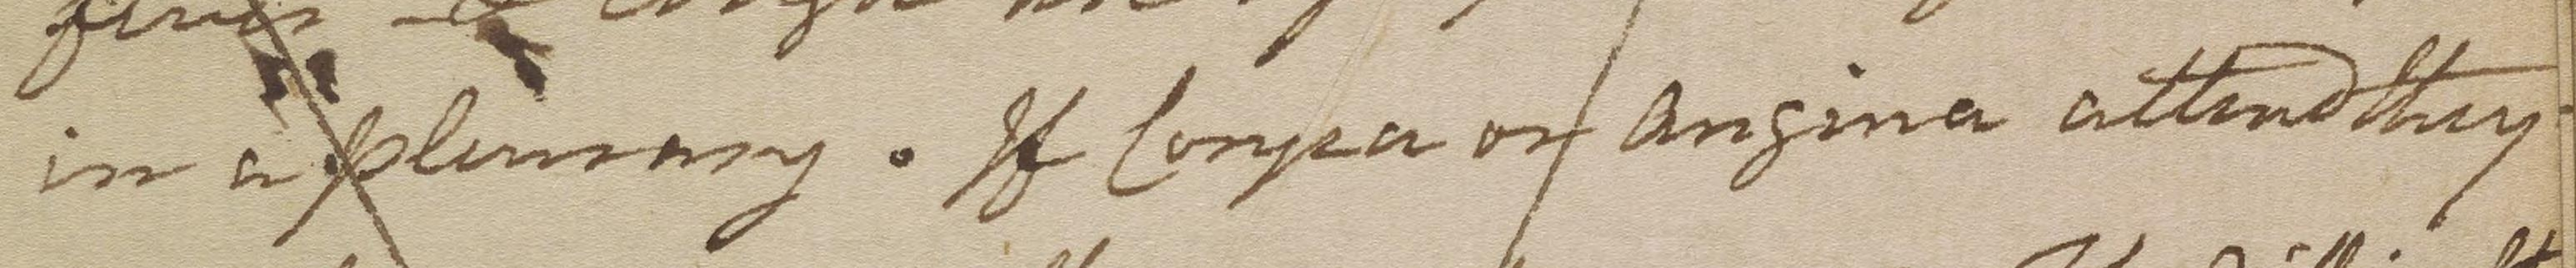in a pleurisy. If Corysa or angina attend they
